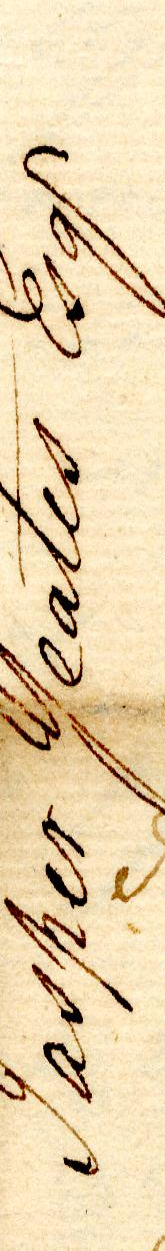Jasper Yeates Esq^r
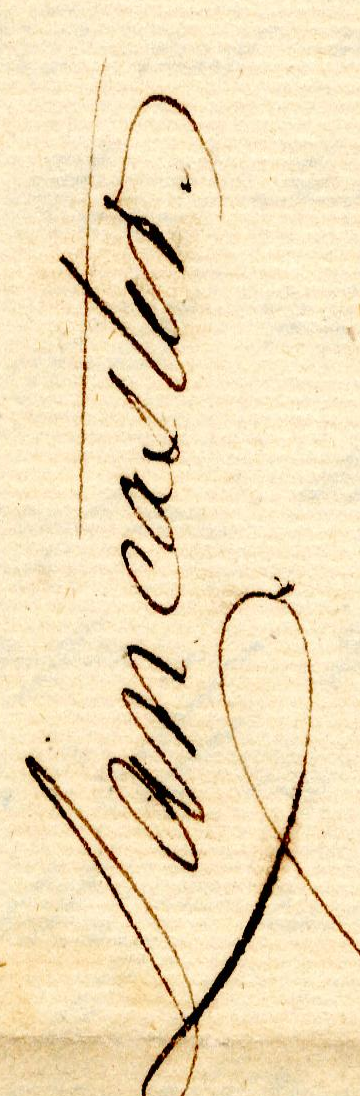Lancaster
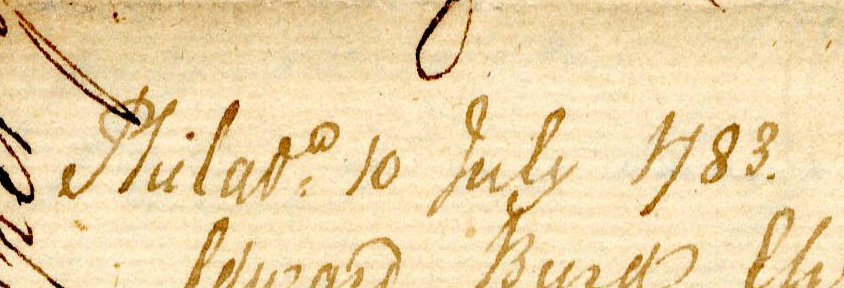Philad^a 10 July 1783.
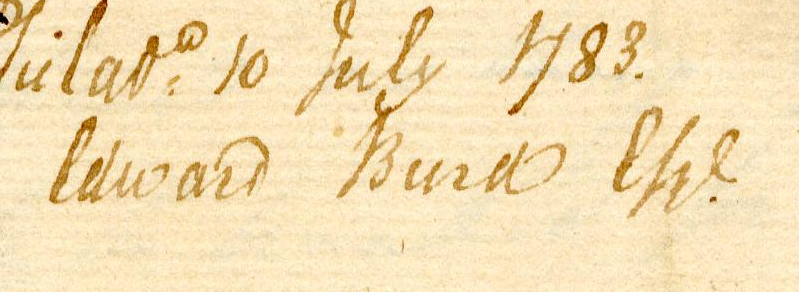Edward Burd Esq^r.
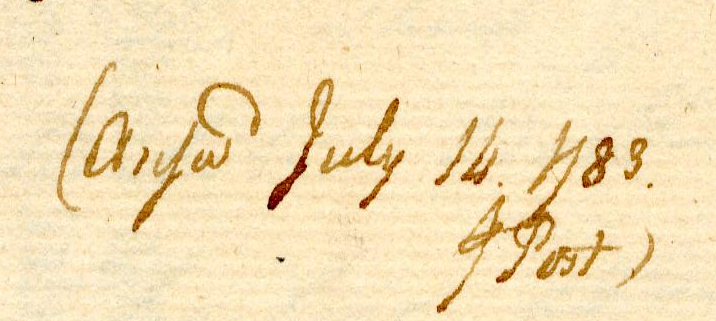(Answ^d July 14. 1783.
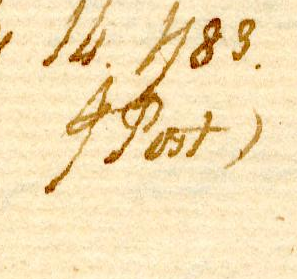Per Post)
